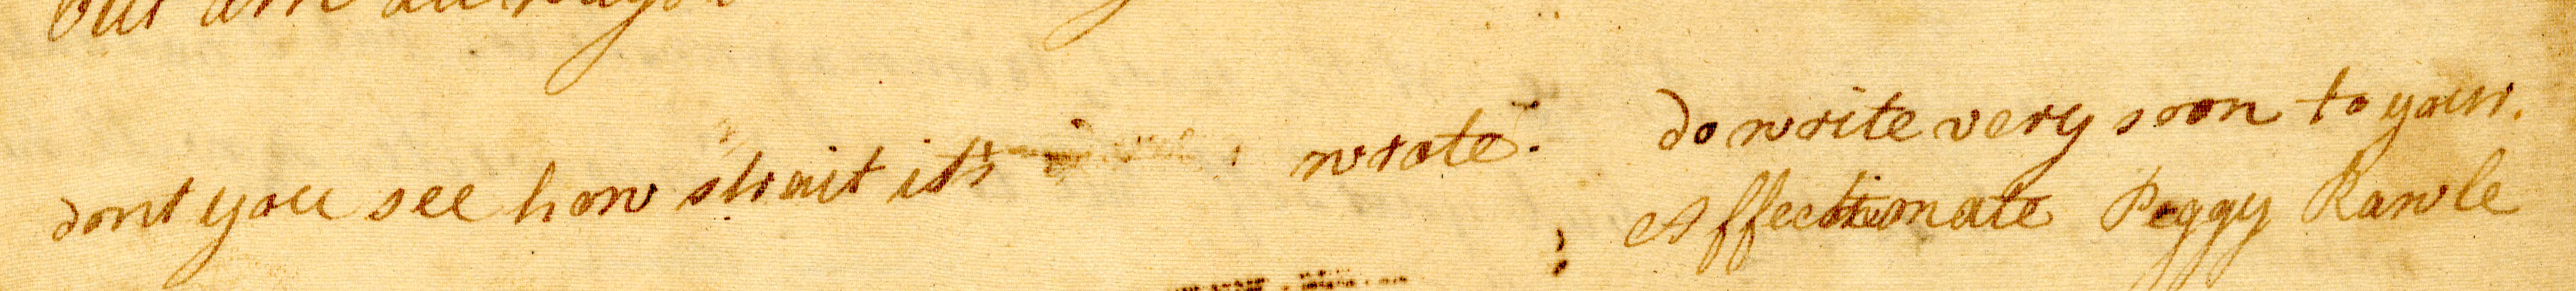dont you see how short its wrote. do write very soon to your
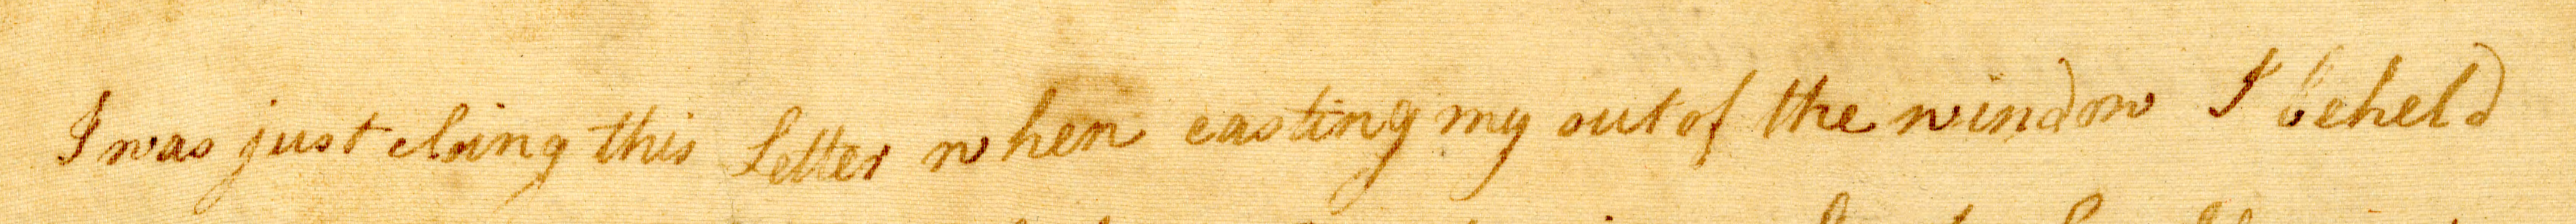I was just closing this Letter when casting my out of the window I beheld
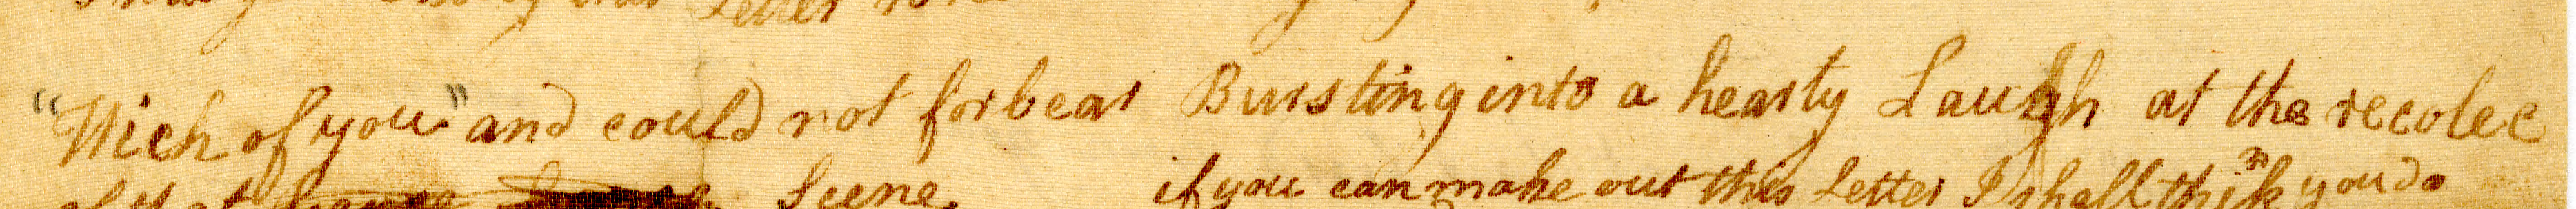"Wich of you" and could not forbear Bursting into a hearty Laugh at the recolee
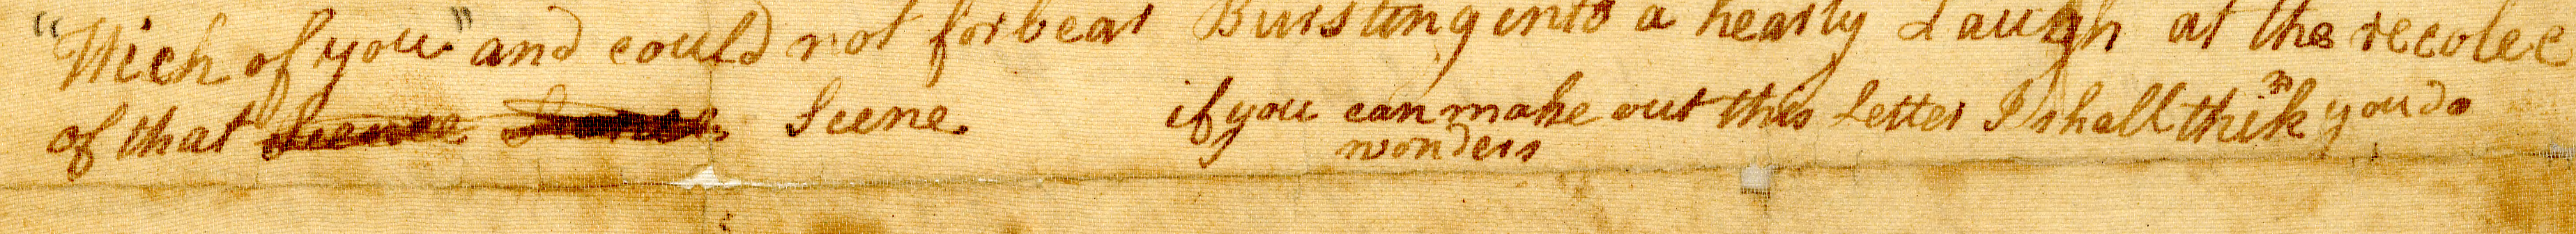of that [Scence] [Scence] scene. if you can make out this letter I shall think you do
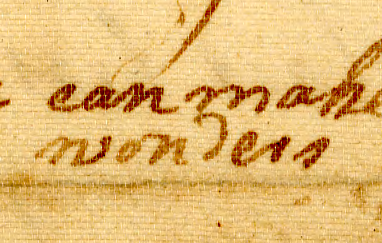wonders
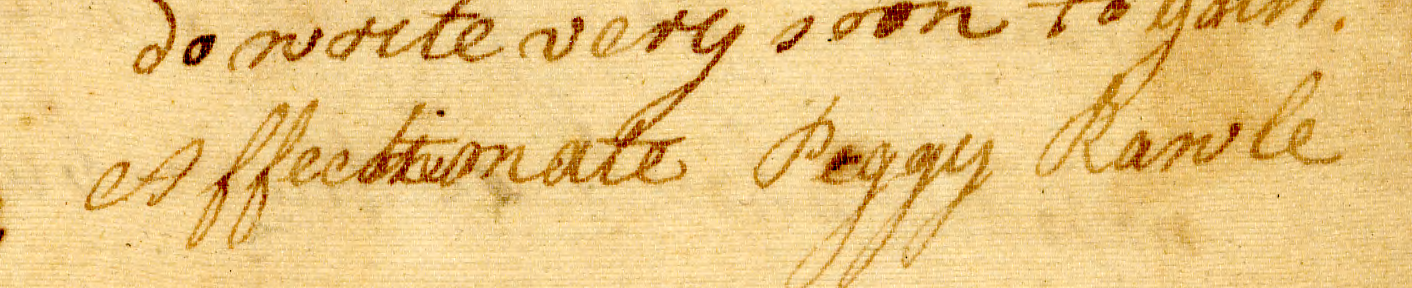Affectionate Peggy Rawle
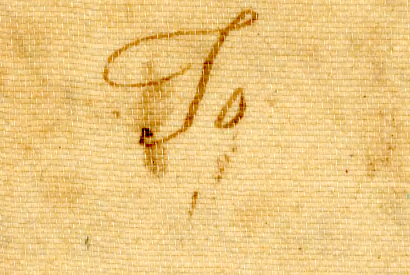To
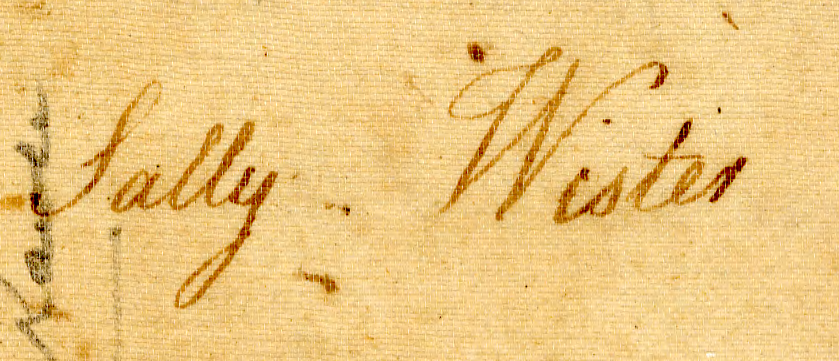Sally Wister
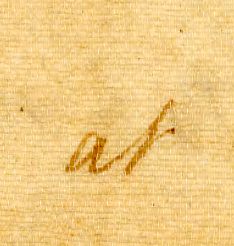at
